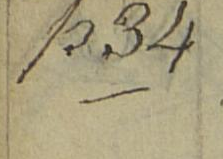p 34
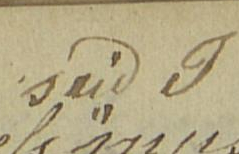said I
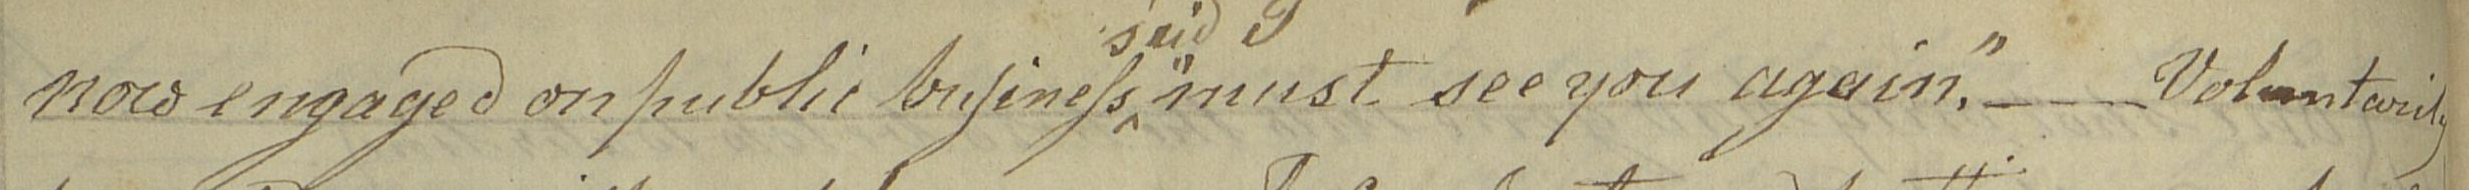now engaged on public business ^ "must see you again." Voluntarily
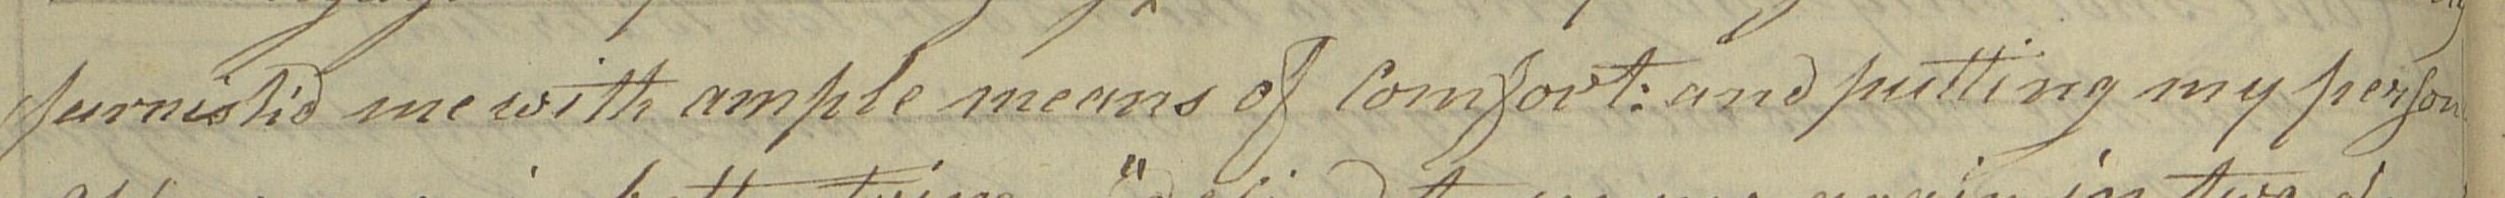furnish'd me with ample means of comfort: and putting my person
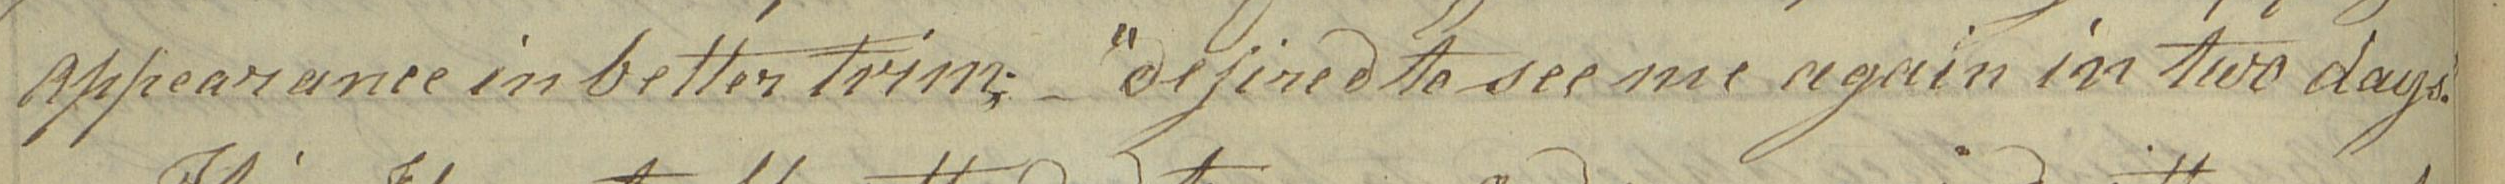apperrance in better trim: "desired to see me again in two days."
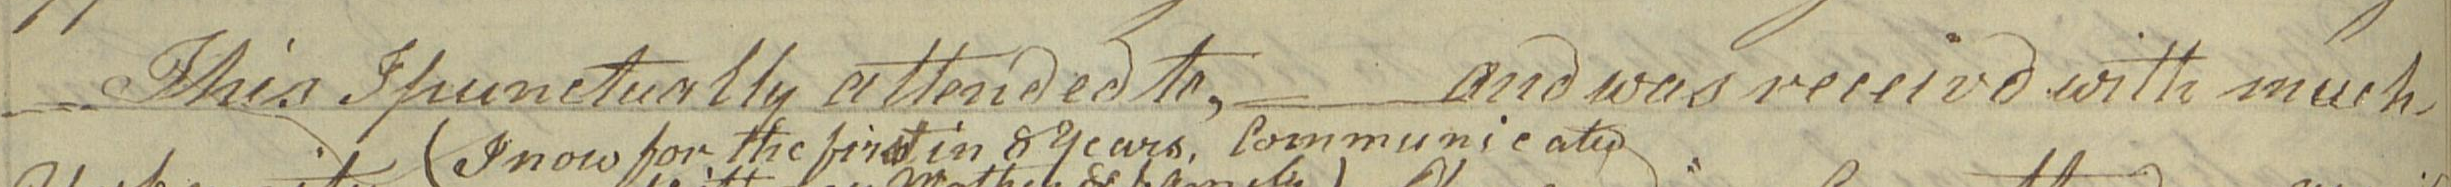This I punctually attended to, and was receivd with much
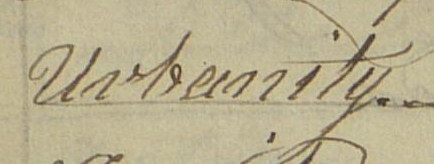Urbanity.
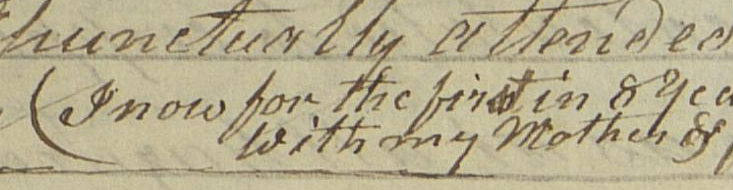(I now for the first in 8 years, Communicated
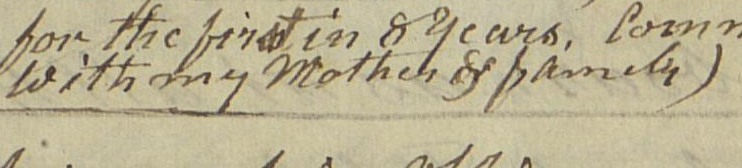with my Mother & family)
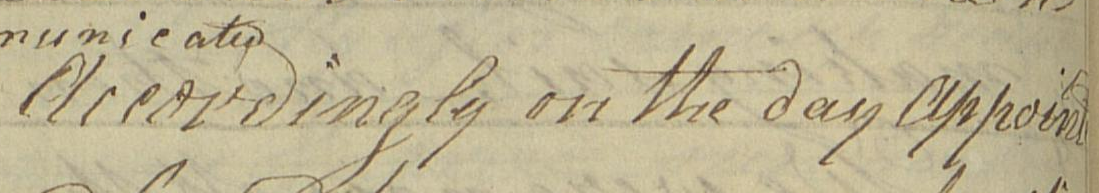Accordingly on the day Appoint-
